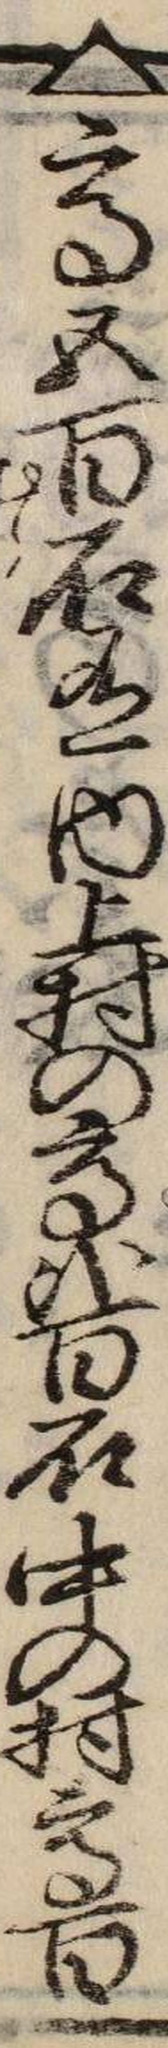△高五百石有内上村の高弐百石中の村高百
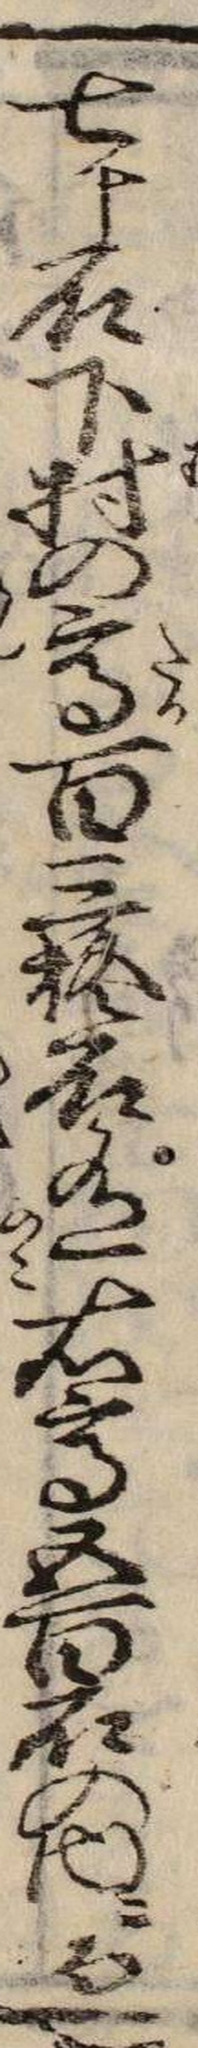七十石下村の高百三拾石有右高五百石の内に而
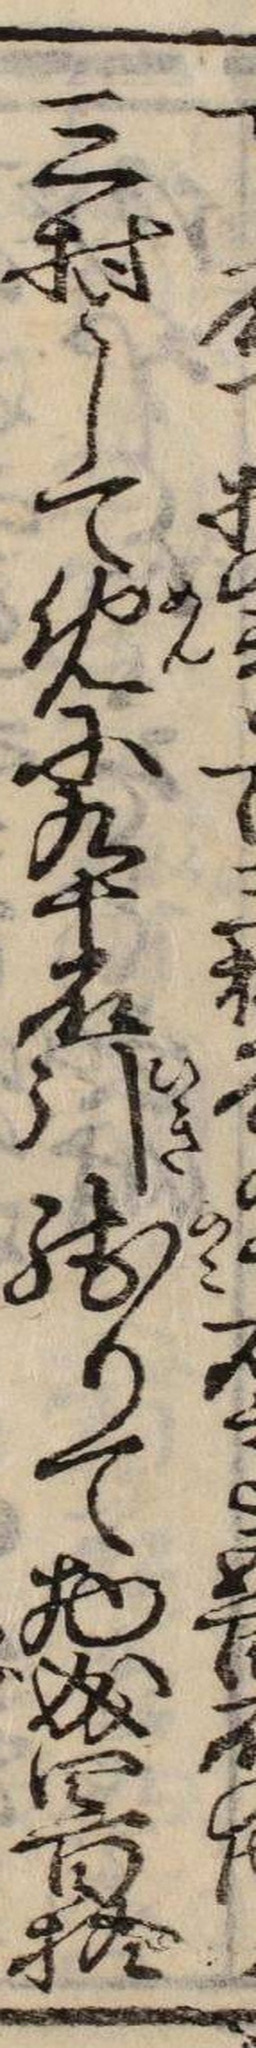三村として免に九十石引残りて物成四百拾
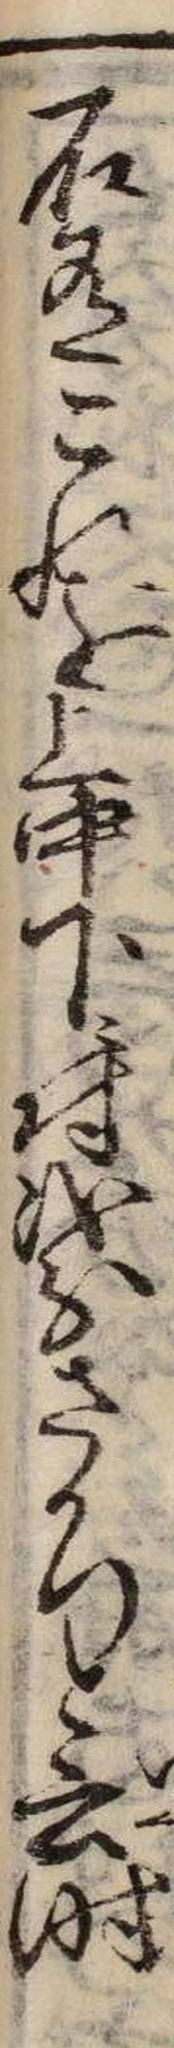石有これを上中下に付弐分さかりと云時
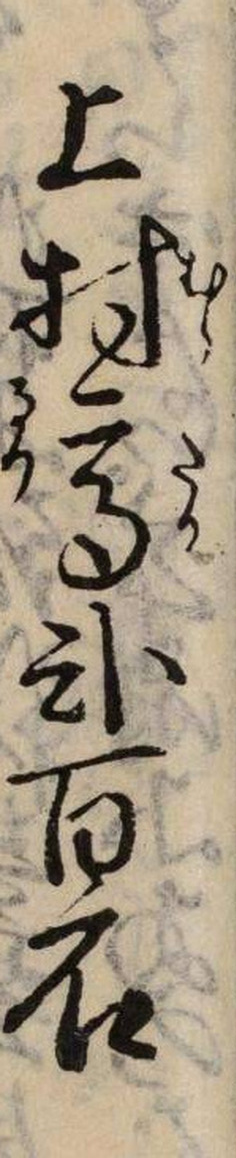上村高弐百石
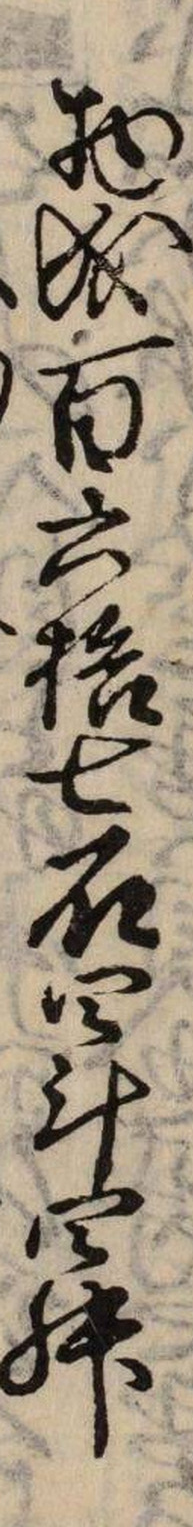物成百六拾七石四斗四升
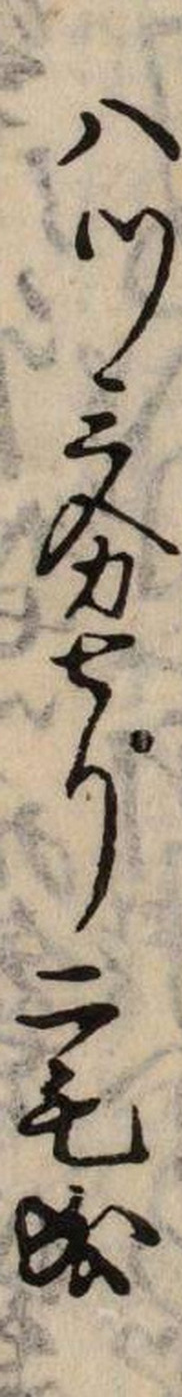八つ三分七り二毛成
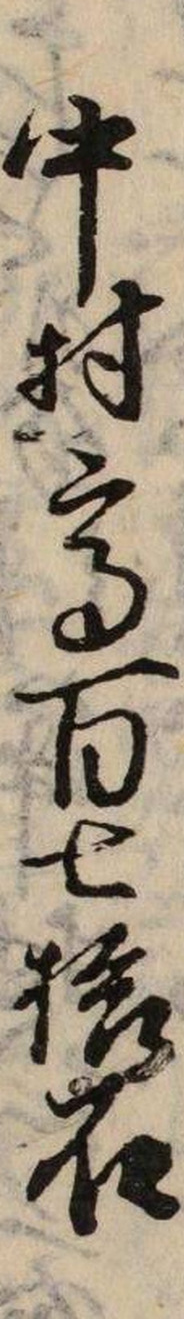中村高百七拾石
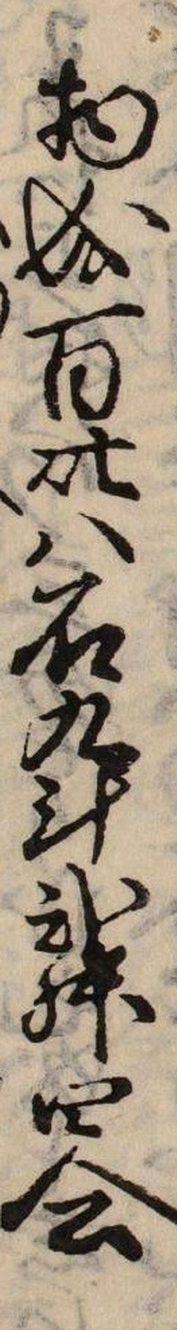物成百卅八石九斗弐升四合
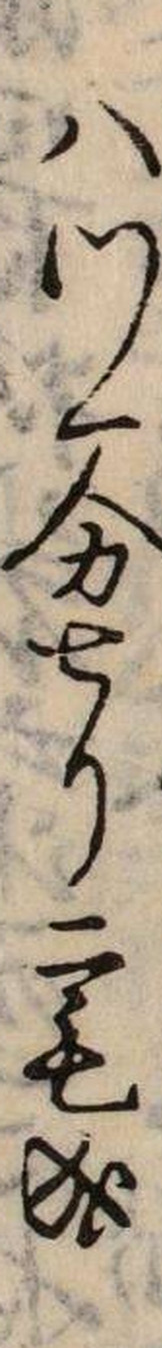八つ一分七り二毛成
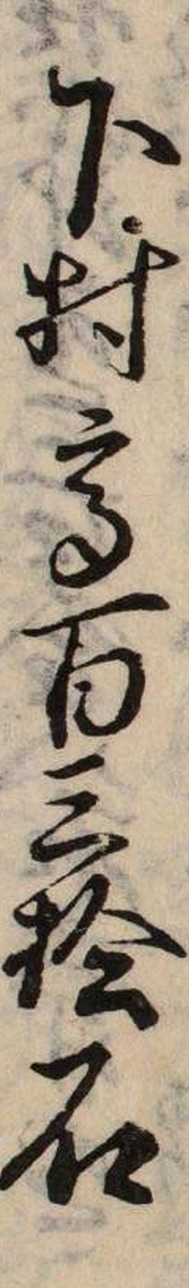下村高百三拾石
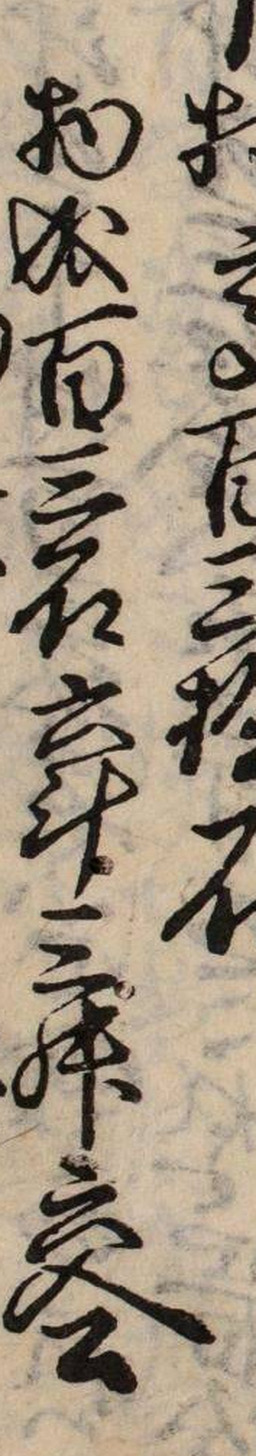物成百三石六斗三升六合
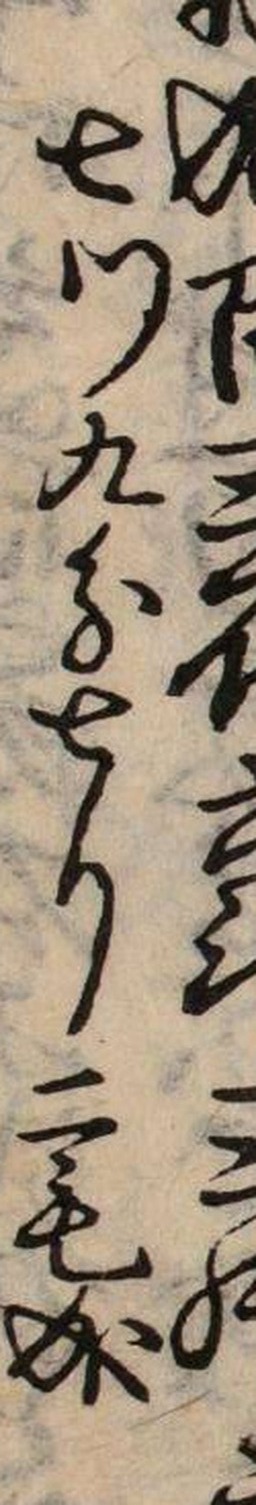七つ九分七り二毛成

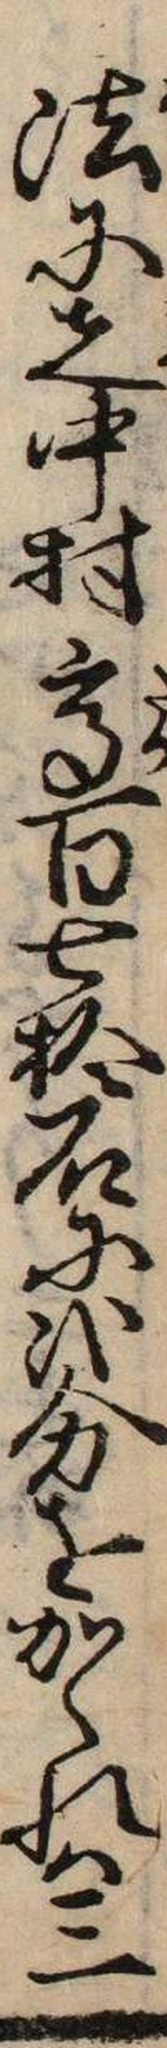法に先中村高百七拾石に弐分をかくれは三
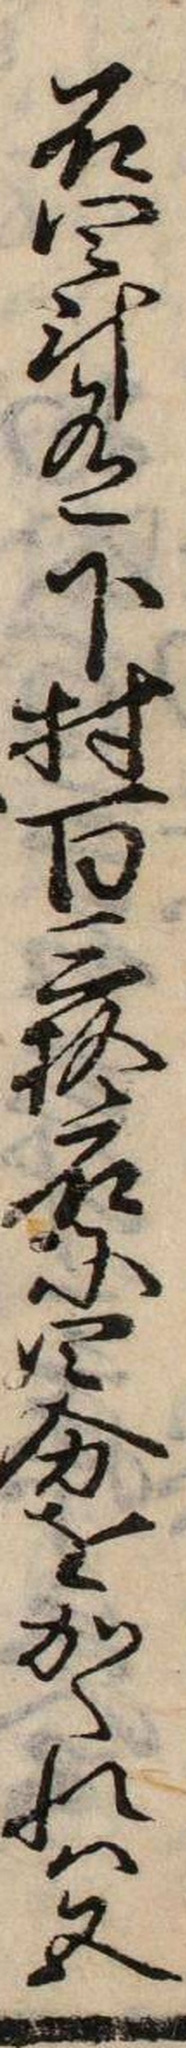石四斗有下村百三拾石に四分をかくれは五
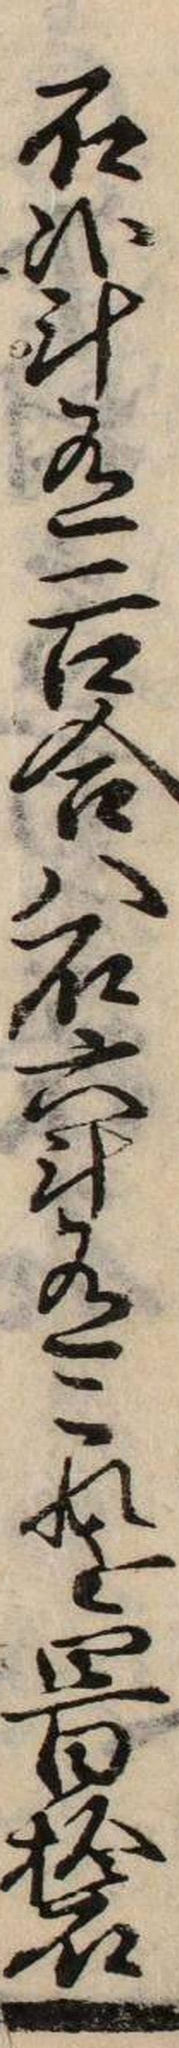石弐斗有三口合八石六斗有これを四百拾石
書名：塵劫記（寛永11年自跋、京都府立京都学・歴彩館追貴8）
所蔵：京都府立京都学・歴彩館 国文学研究資料館
